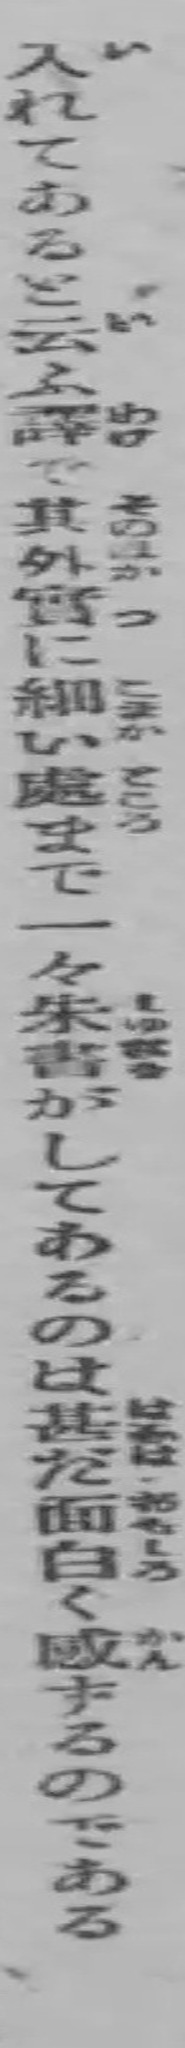入れてあると云ふ訳で其外実に細い処まで一々朱書がしてあるのは甚だ面白く感ずるのである
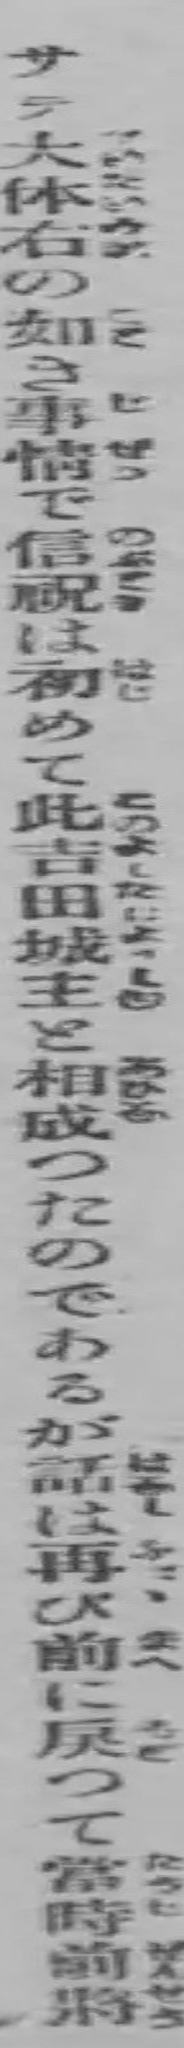サテ大体右の如き事情で信祝は初めて此吉田城主と相成つたのであるが話は再び前に戻つて当時前将
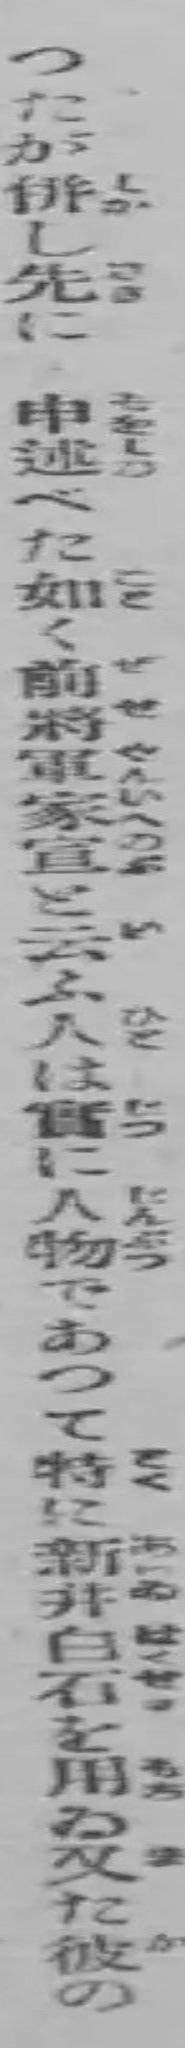つたが併し先にも申述べた如く前将軍家宣と云ふ人は実に人物であつて特に新井白石を用ゐ又た彼の
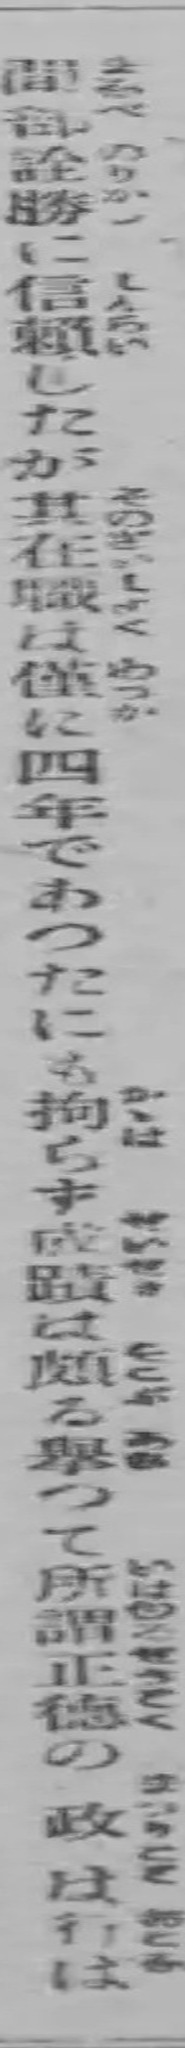間部詮勝に信頼したが其在職は僅に四年であつたにも拘らず成蹟は頗る挙つて所謂正徳の政は行は
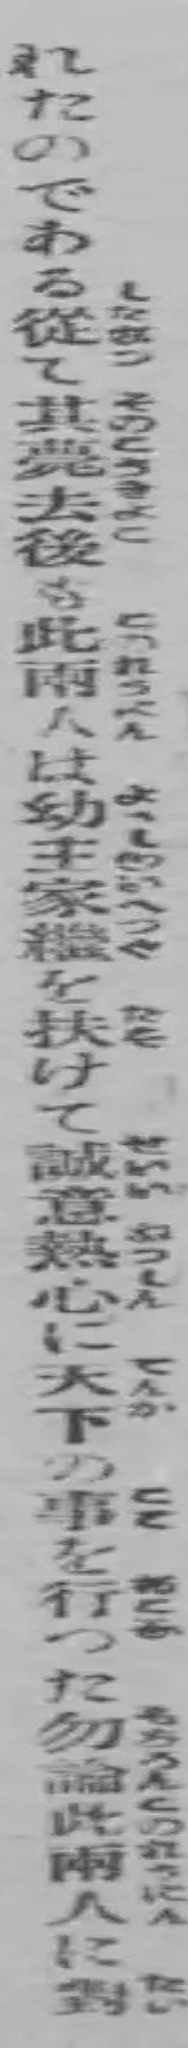れたのである従て其薨去後も此両人は幼主家継を扶けて誠意熱心に天下の事を行つた勿論此両人に対
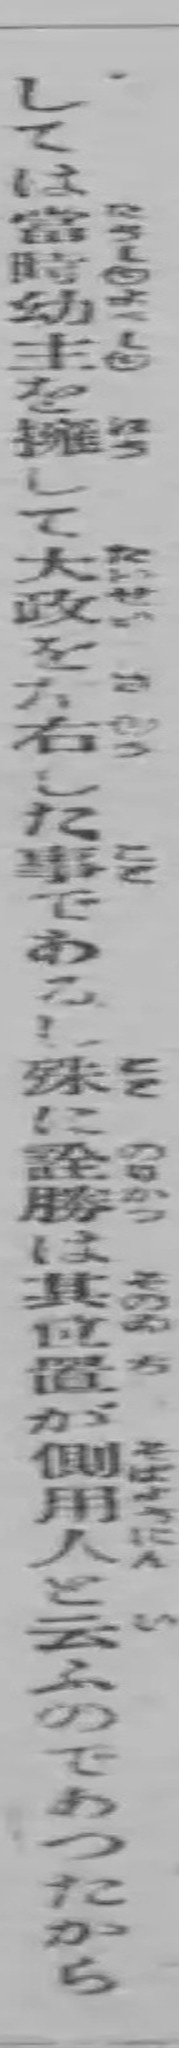しては当時幼主を擁して大政を左右した事であるし殊に詮勝は其位置が側用人と云ふのであつたから
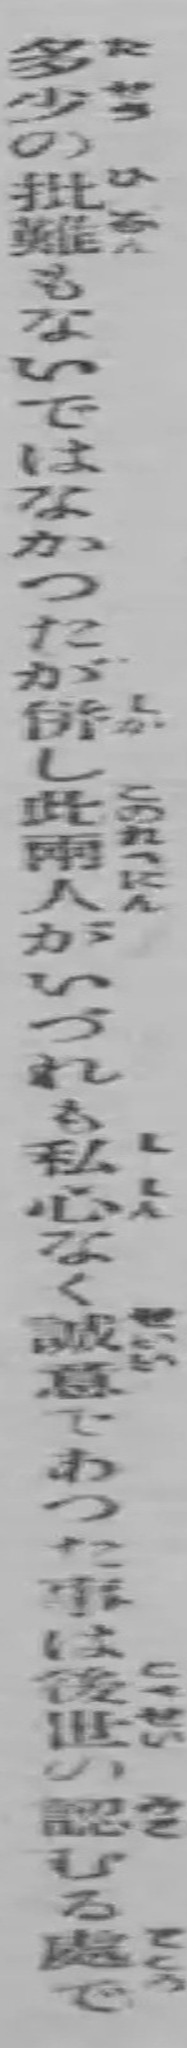多少の批難もないではなかつたが併し此両人がいづれも私心なく誠意であつた事は後世の認むる処で
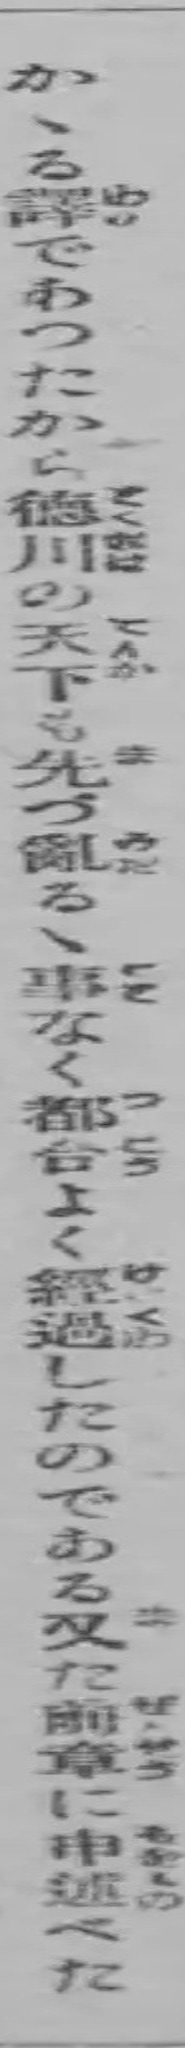かゝる訳であつたから徳川の天下も先づ乱るゝ事なく都合よく経過したのである又た前章に申述べた
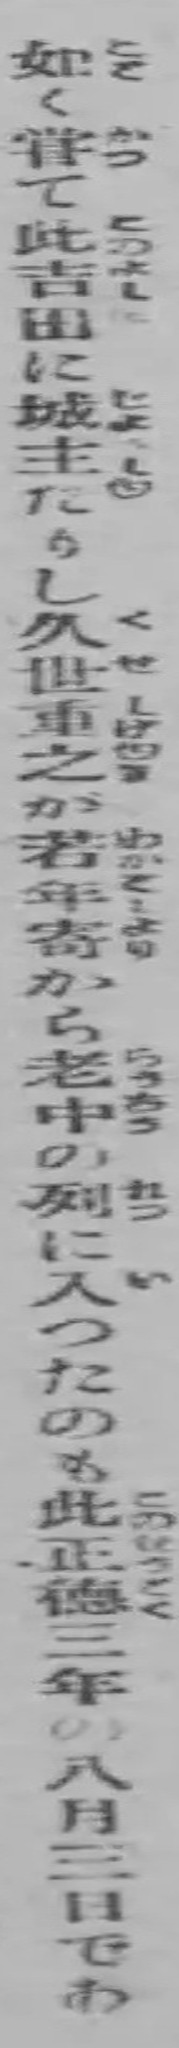如く嘗此吉田に城主たりし久世重之が若年寄から老中の列に入つたのも此正徳三年の八月三日であ

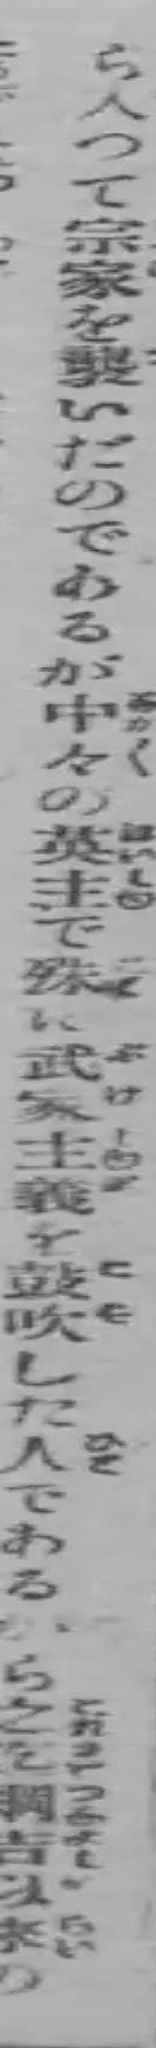ら入つて宗家を襲いだのであるが中々の英主で殊に武家主義を鼓吹した人であるから之迄綱吉以来の
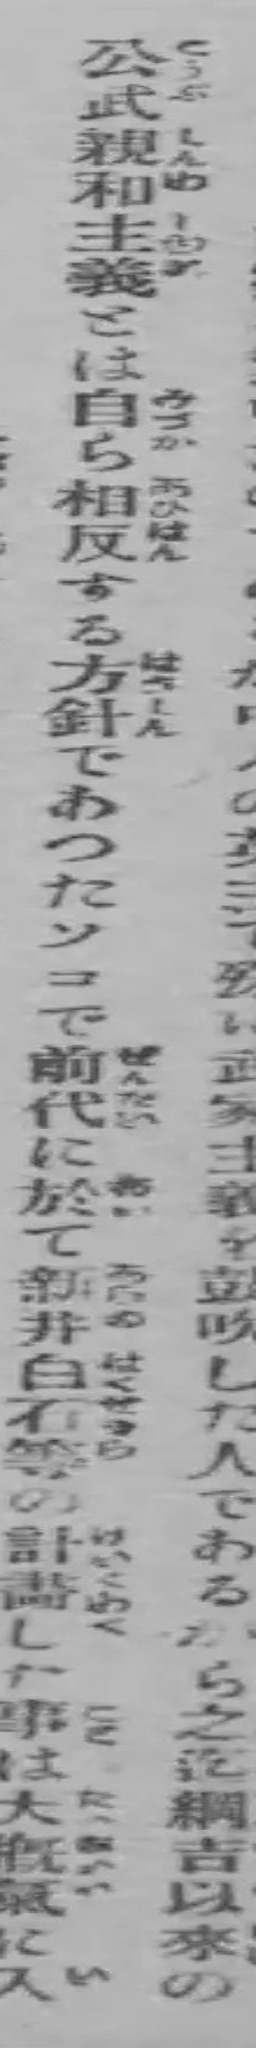公武親和主義とは自ら相反する方針であつたソコで前代に於て新井白石等の計画した事は大概気に入
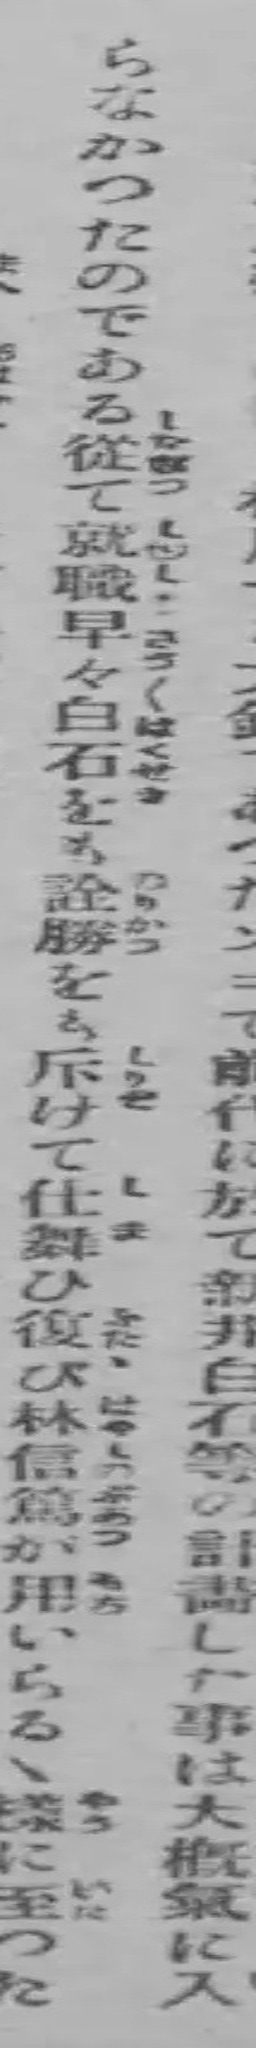らなかつたのである従て就職早々白石をも詮勝をも斥けて仕舞ひ復び林信篤が用いらるゝ様に至つた
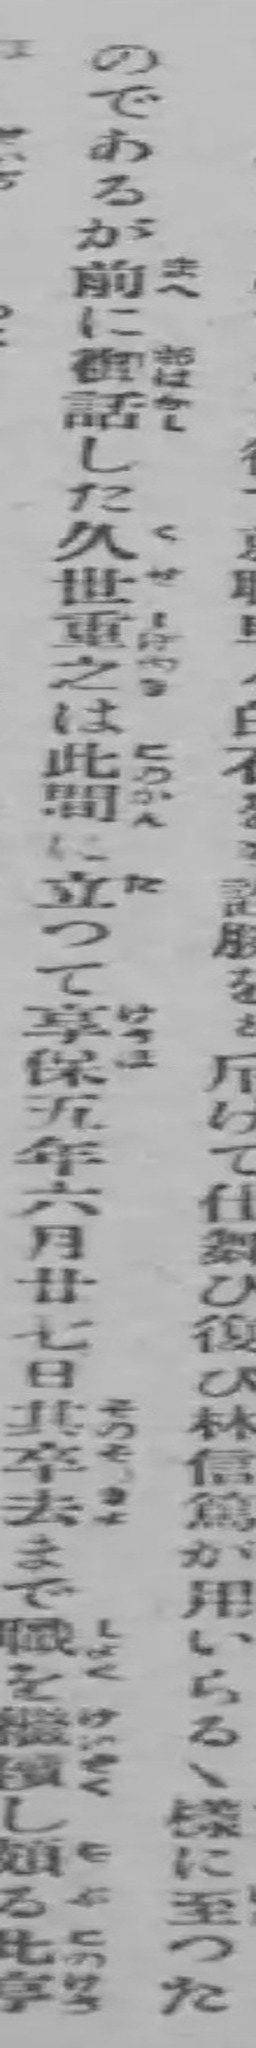のであるが前に御話した久世重之は此間に立つて享保五年六月廿七日其卒去まで職を継続し頗る此享
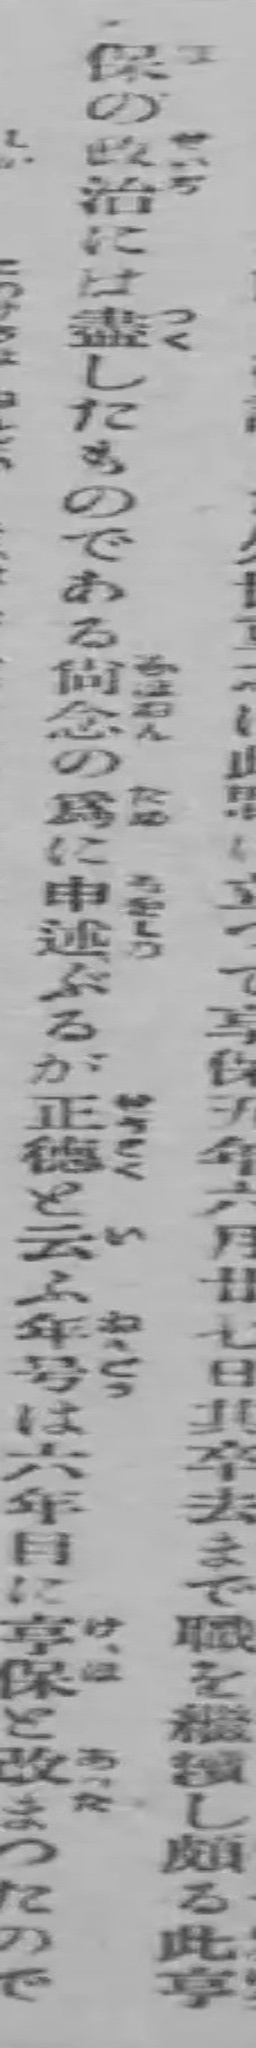保の政治には尽したものである尚念の為に申述ぶるが正徳と云ふ年号は六年目に享保と改まつたので
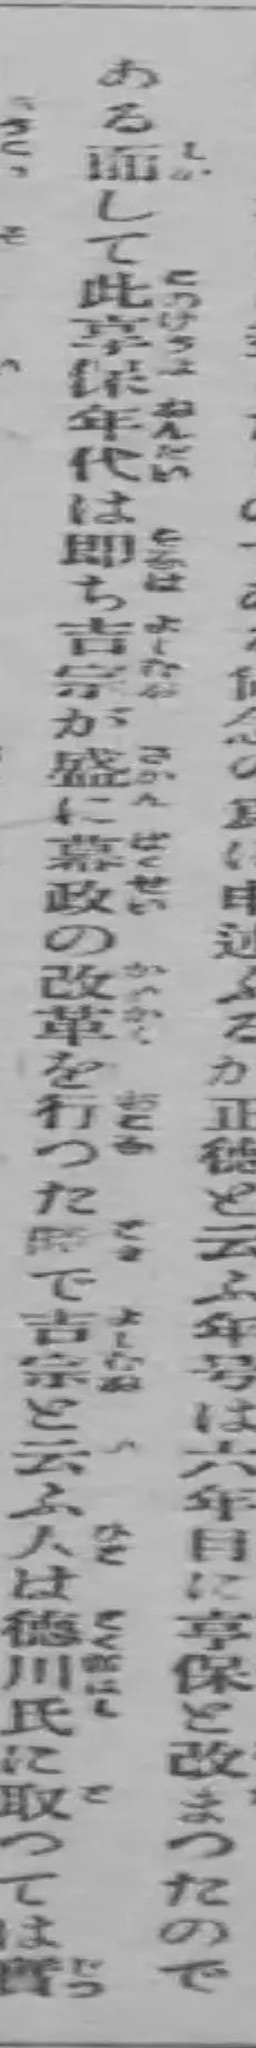ある而して此享保年代は即ち吉宗が盛に幕政の改革を行つた時で吉宗と云ふ人は徳川氏に取つては実
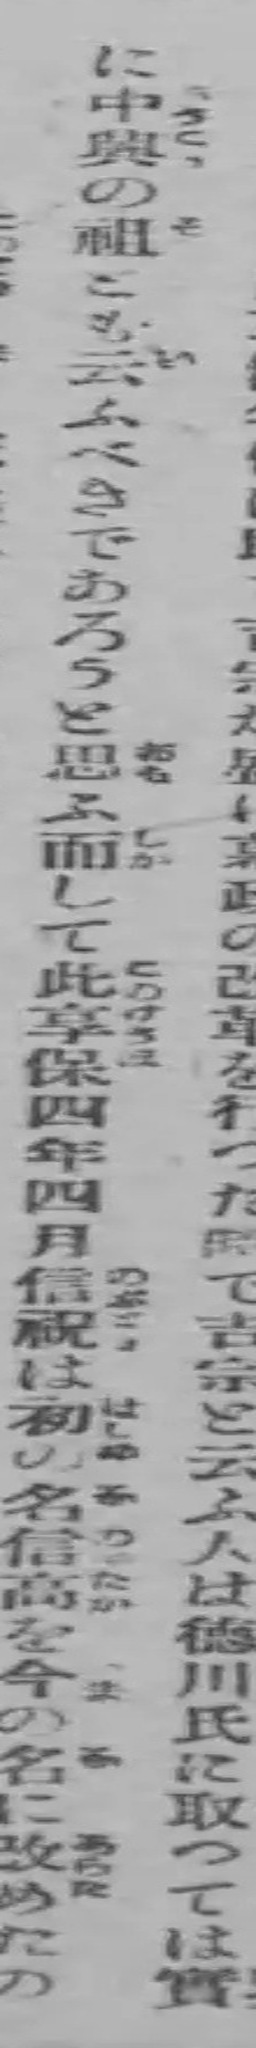に中興の祖とも云ふべきであろうと思ふ而して此享保四年四月信祝は初の名信高を今の名に改めたの
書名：豊橋市史談
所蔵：国立国会図書館 National Diet Library, JAPAN
